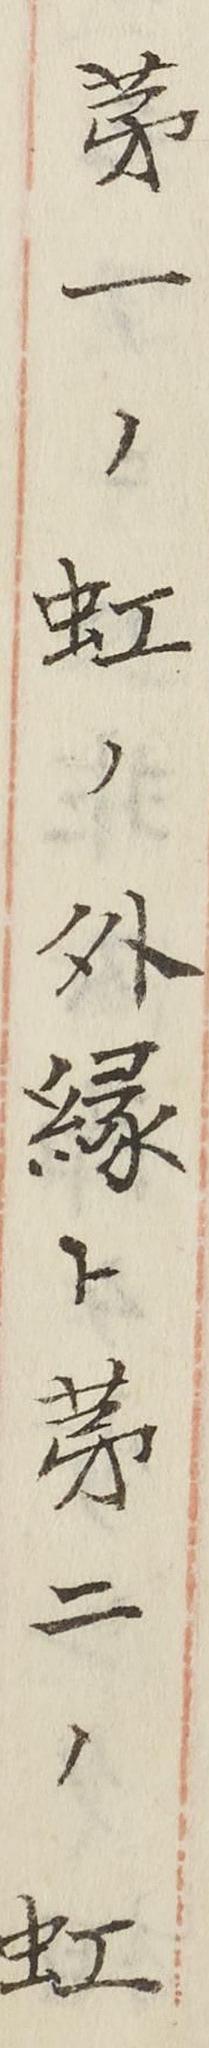図第一ノ虹ノ外縁ト第二ノ虹
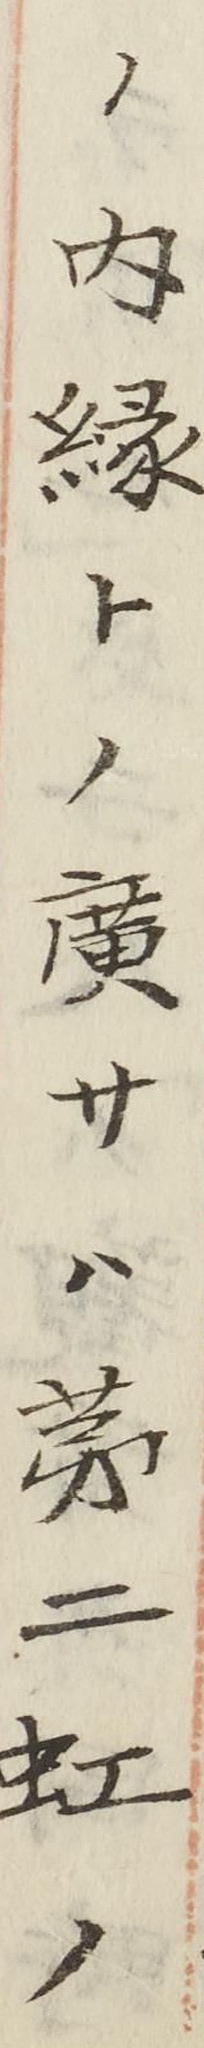ノ内縁トノ広サハ第二虹ノ
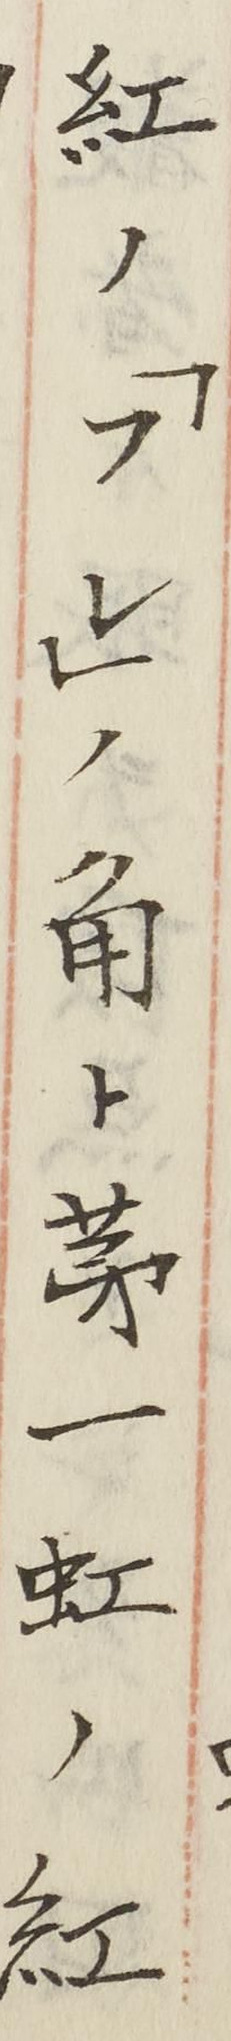ｓ紅ノ「フレ」ノ角ト第一虹ノ紅
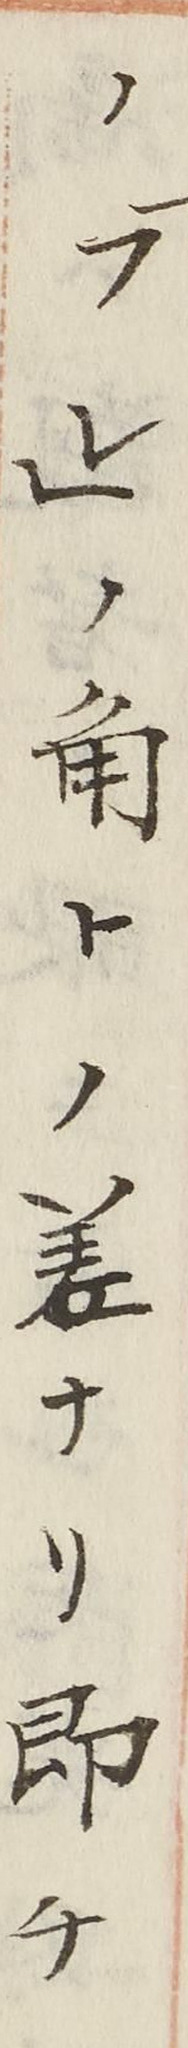ノ「フレ」ノ角トノ差ナリ即チ
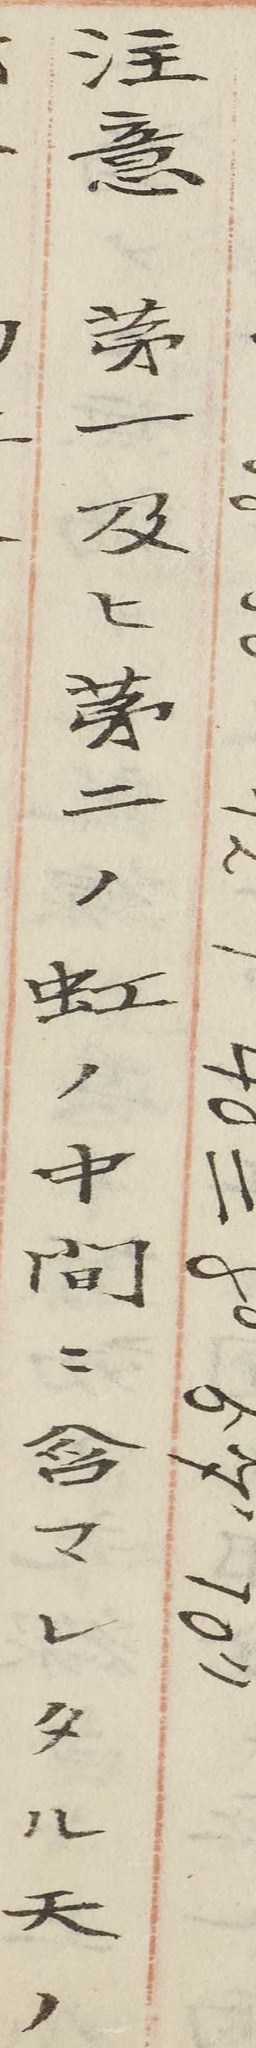注意第一及ヒ第二ノ虹ノ中間ニ含マレタル天ノ
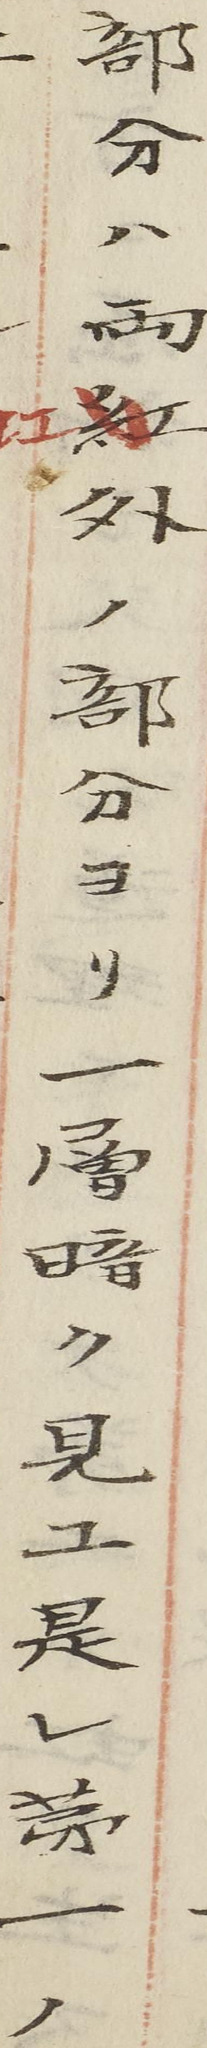部分ハ両虹外ノ部分ヨリ一層暗ク見ユ是レ第一ノ
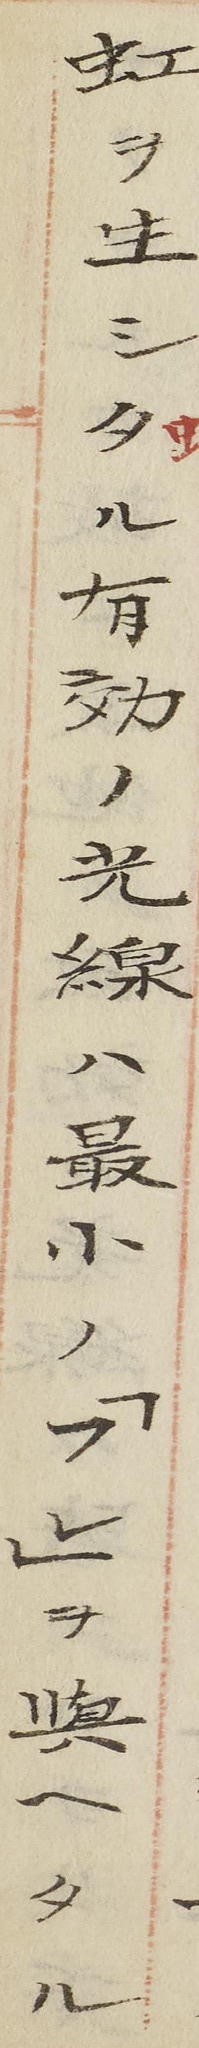虹ヲ生シタル有効ノ光線ハ最小ノ「フレ」ヲ与ヘタル

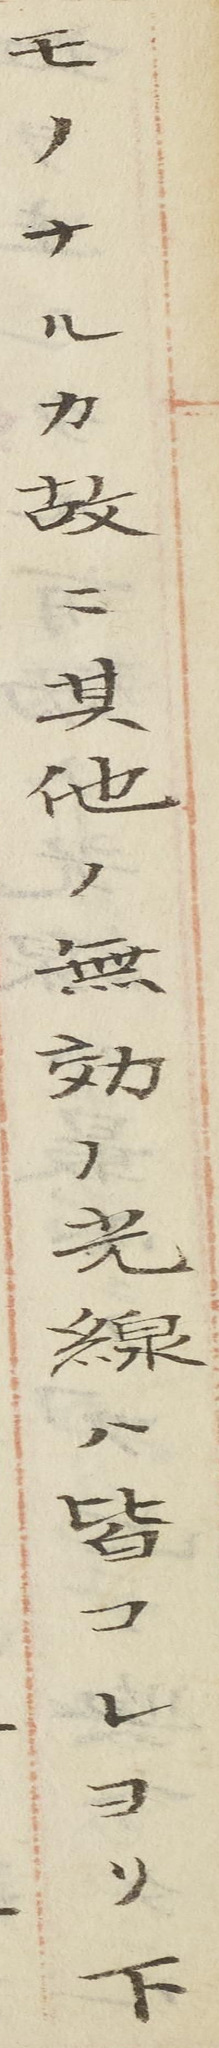モノナルカ故ニ其他ノ無効ノ光線ハ皆コレヨリ下
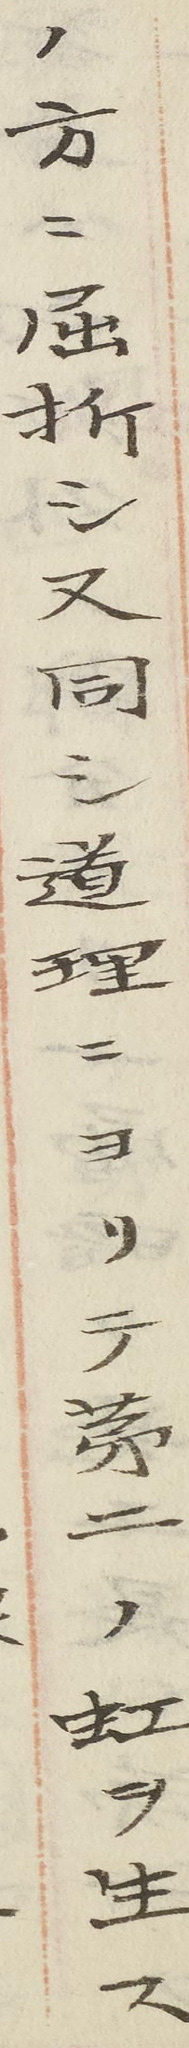ノ方ニ屈折シ又同シ道理ニヨリテ第二ノ虹ヲ生ス
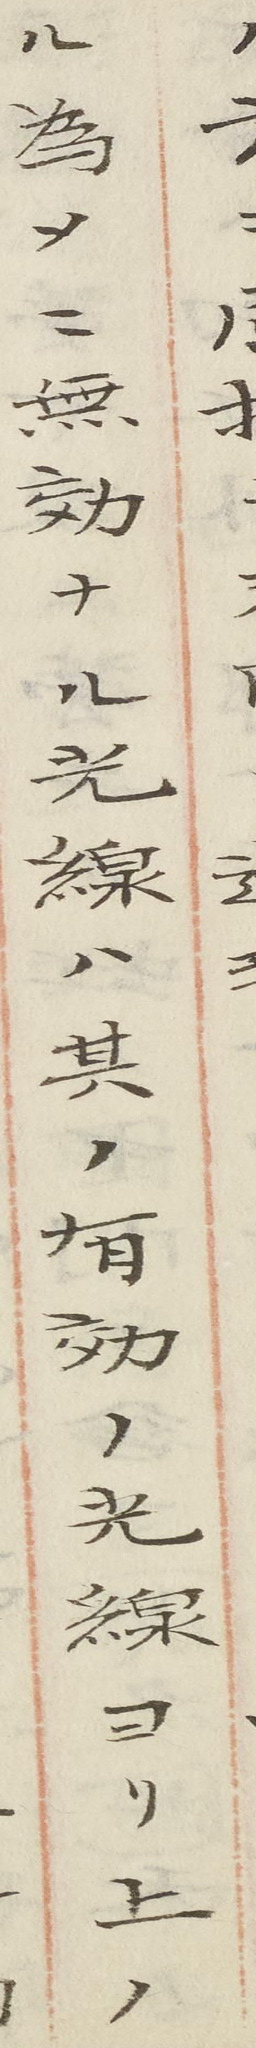ル為メニ無効ナル光線ハ其有効ノ光線ヨリ上ノ
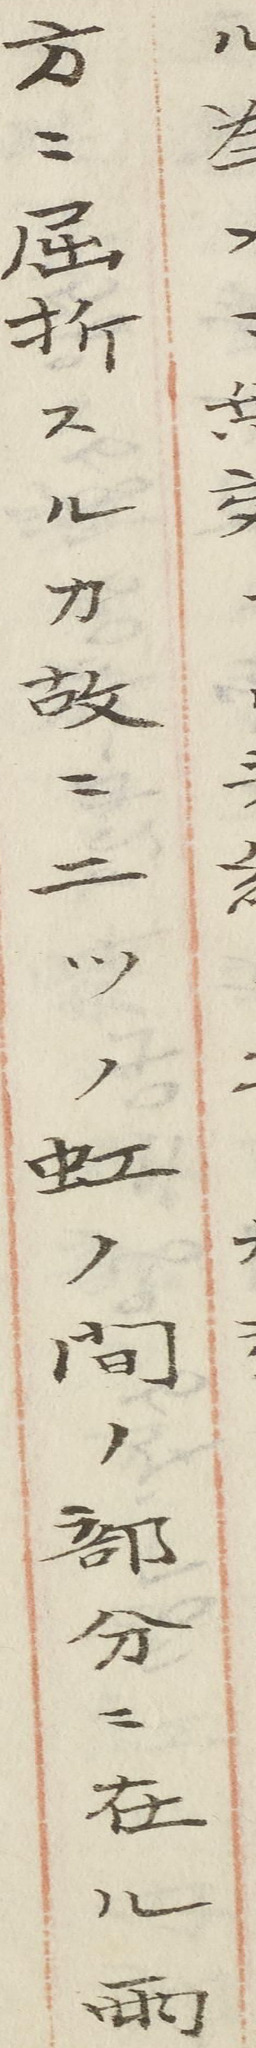方ニ屈折スルカ故ニ二ツノ虹ノ間ノ部分ニ在ル両
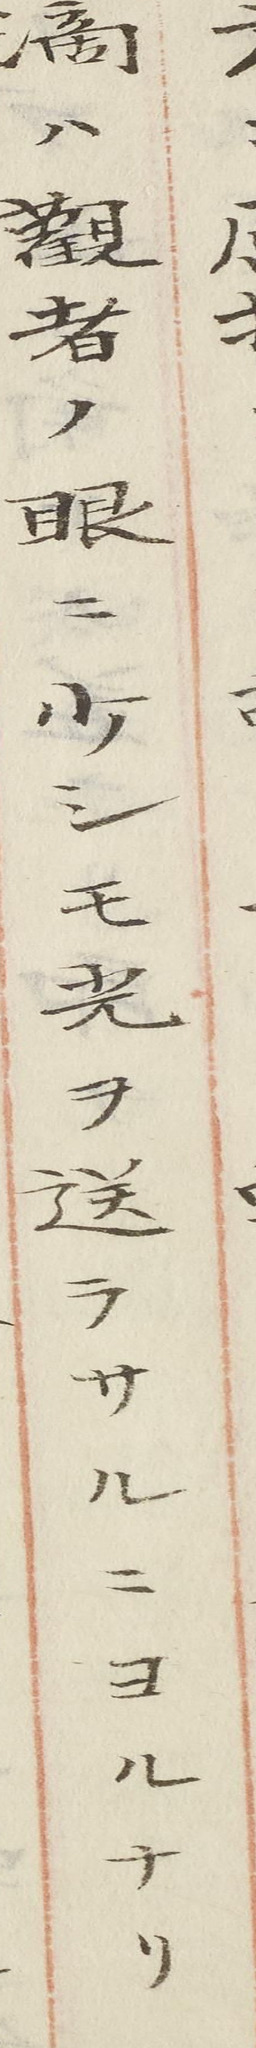滴ハ観者ノ眼ニ少シモ光ヲ送ラサルニヨルナリ
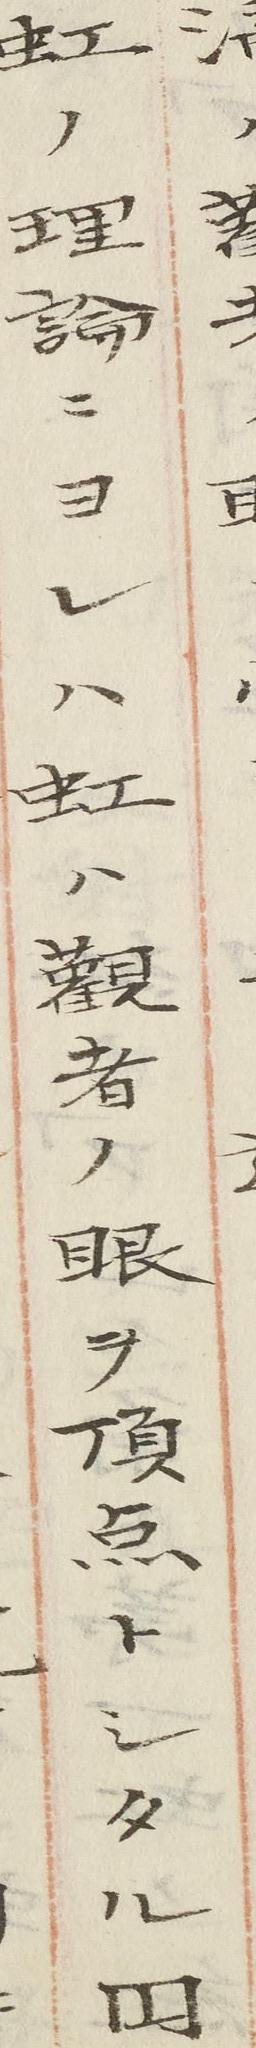虹ノ理論ニヨレハ虹ハ観者ノ眼ヲ頂点トシタル円
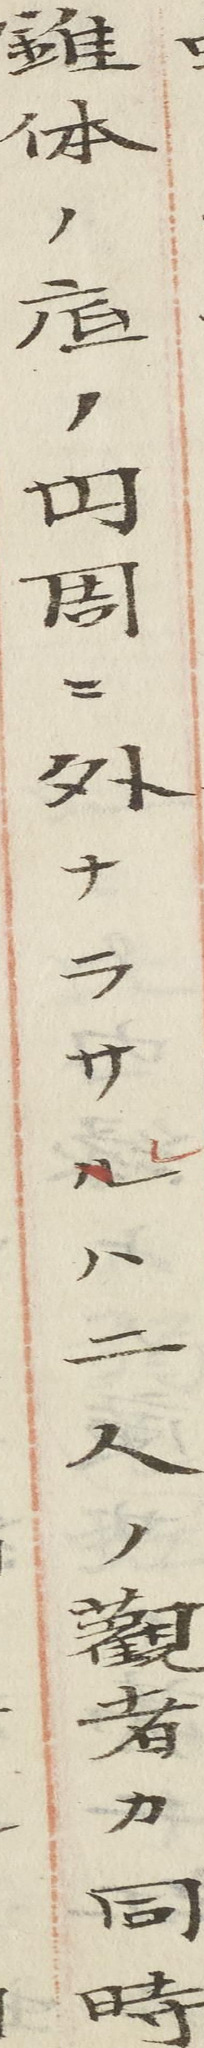錐体ノ底ノ円周ニ外ナラサルハ二人ノ観者カ同時
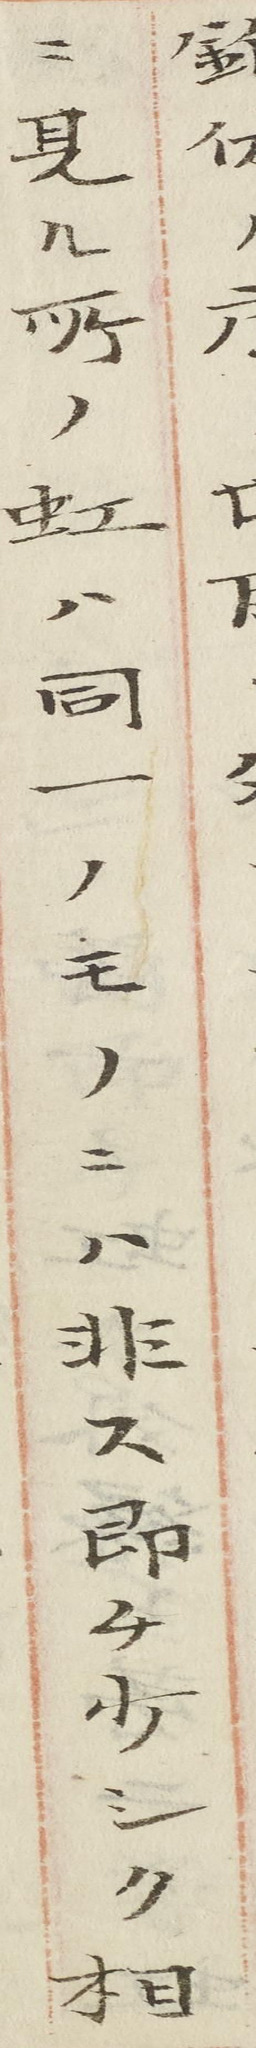ニ見ル所ノ虹ハ同一ノモノニハ非ス即チ少シク相
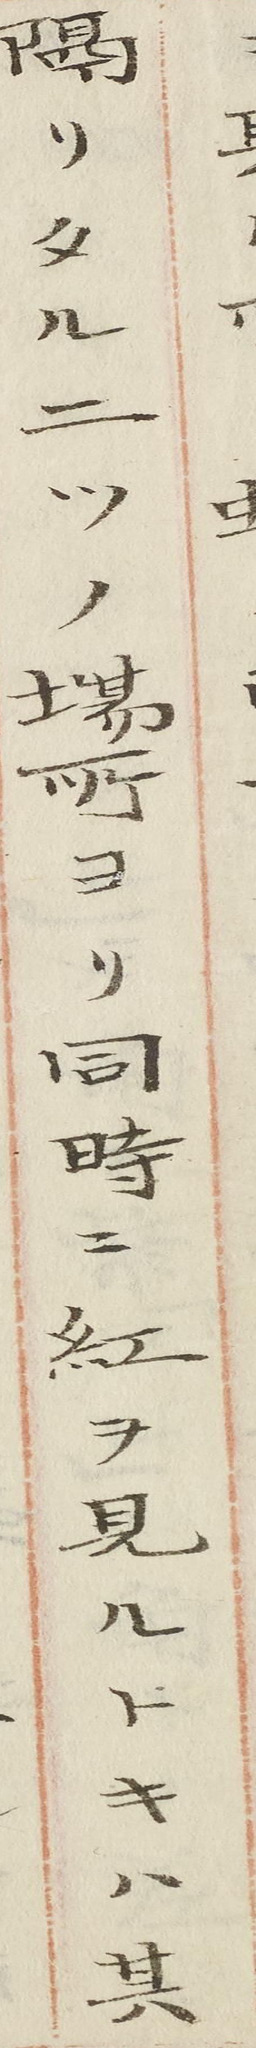隔リタル二ツノ場所ヨリ同時ニ紅ヲ見ルトキハ其
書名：虹及ハロノ説明
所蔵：東京大学地震研究所図書室 Earthquake Research Institute Library, The University of Tokyo, JAPAN
